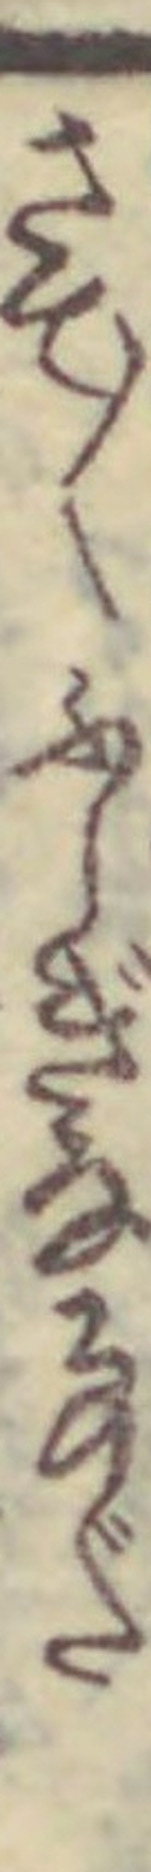さて〳〵ふしぎな事だ
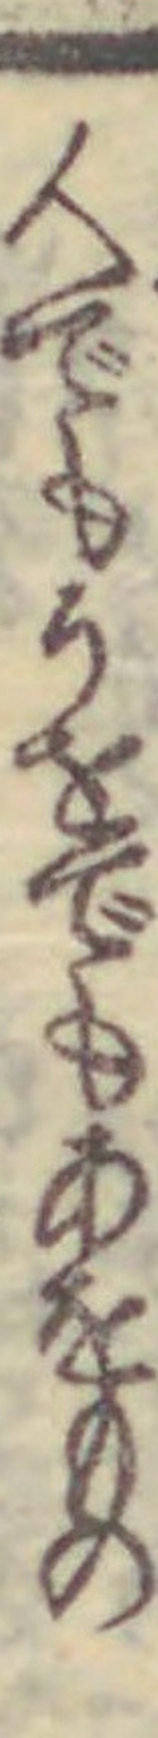人でもうをでもあをもの
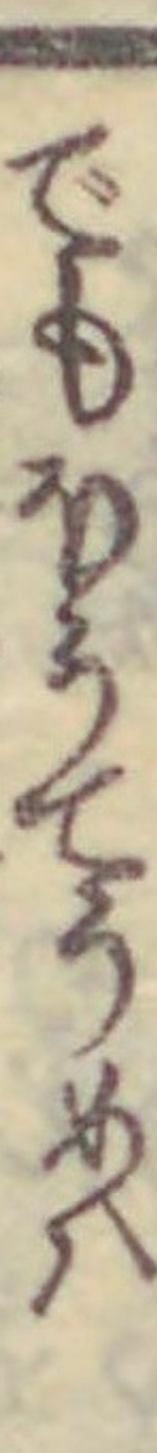でもほうてうめは
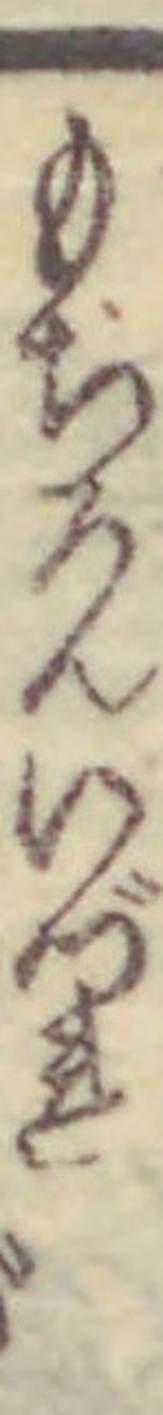もちろんいづれ
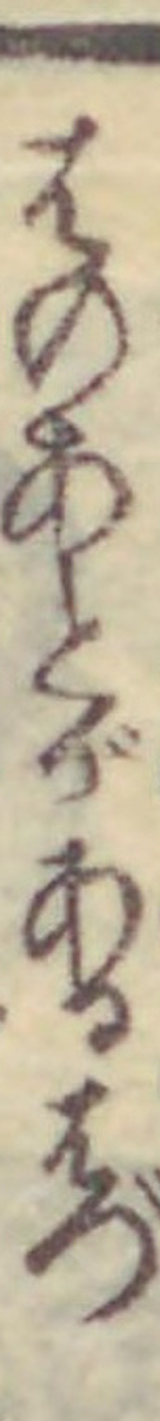はのあとがあるはづ
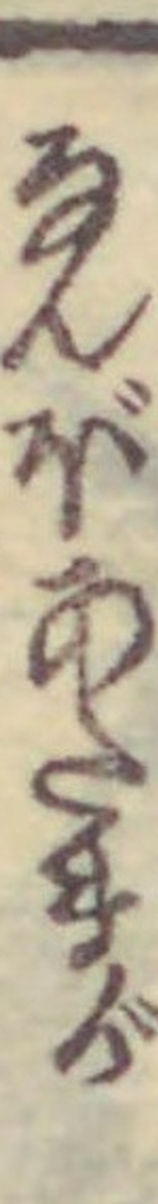なんぼあたまが
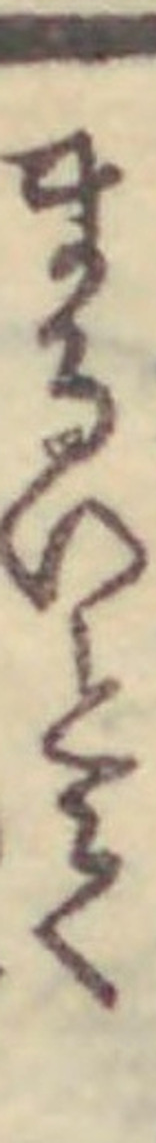まるいとて
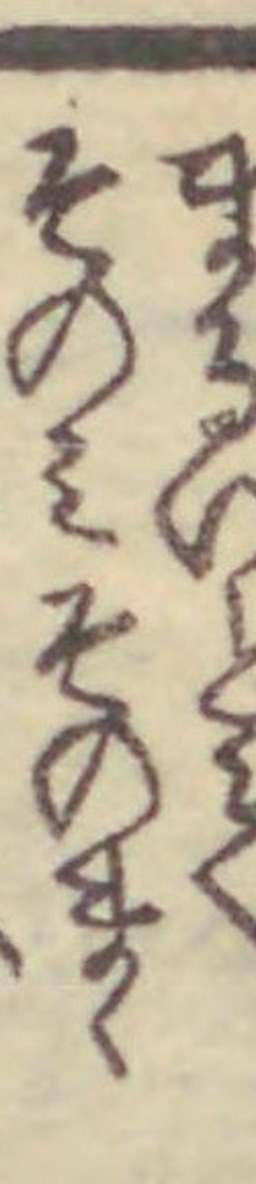そのみそのまゝ
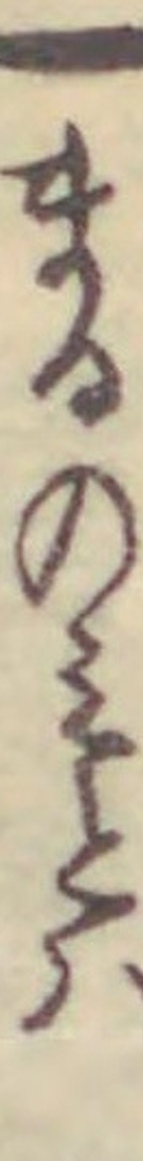まるのみとは
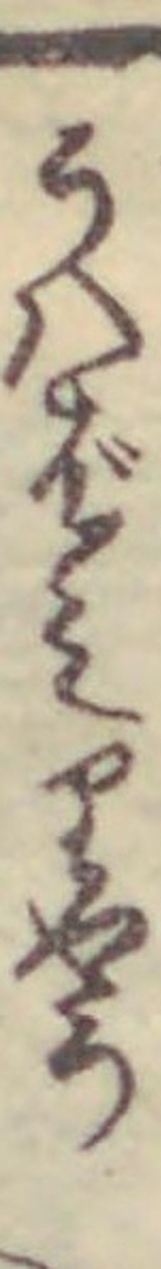うはばみりやう
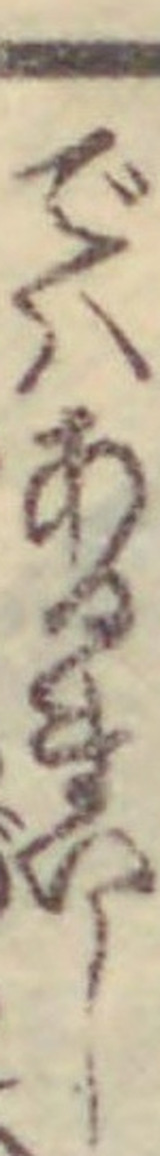ではあるまいし
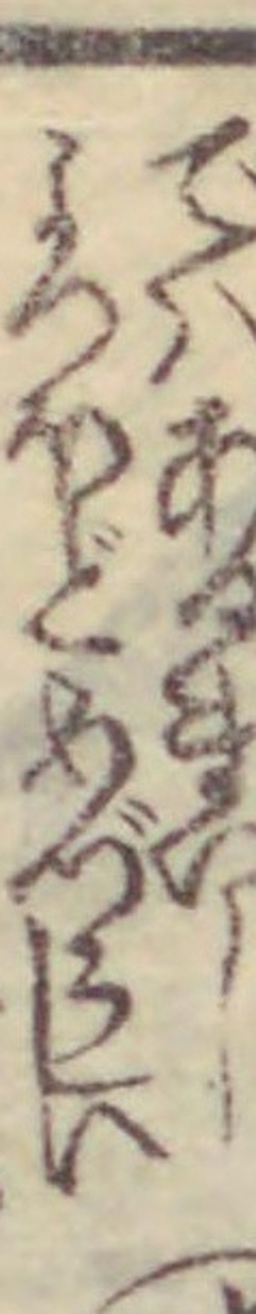よつほどめづらしい
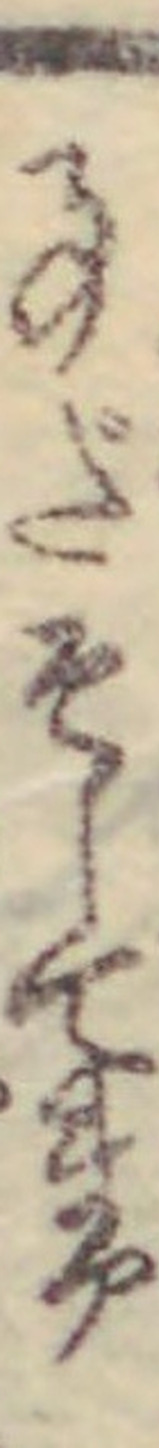事だそしてまア
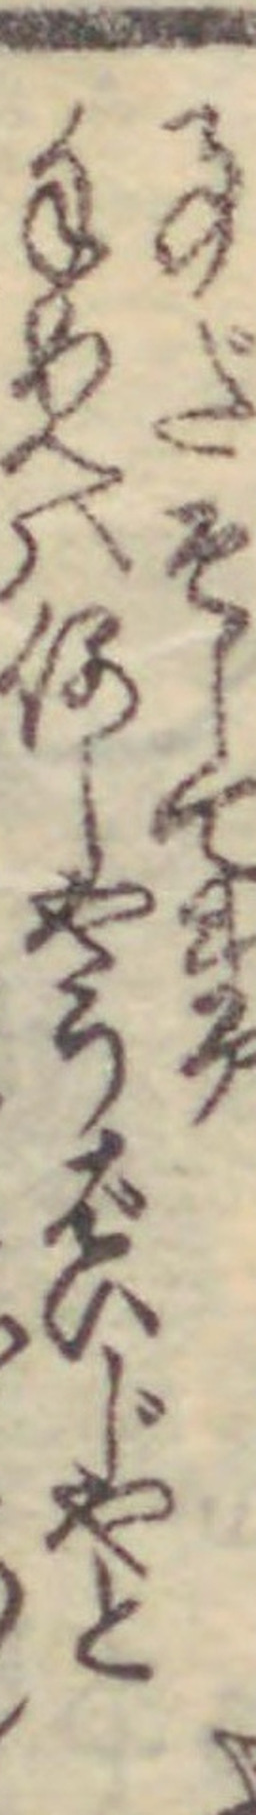手めへは何しやうばいじやと
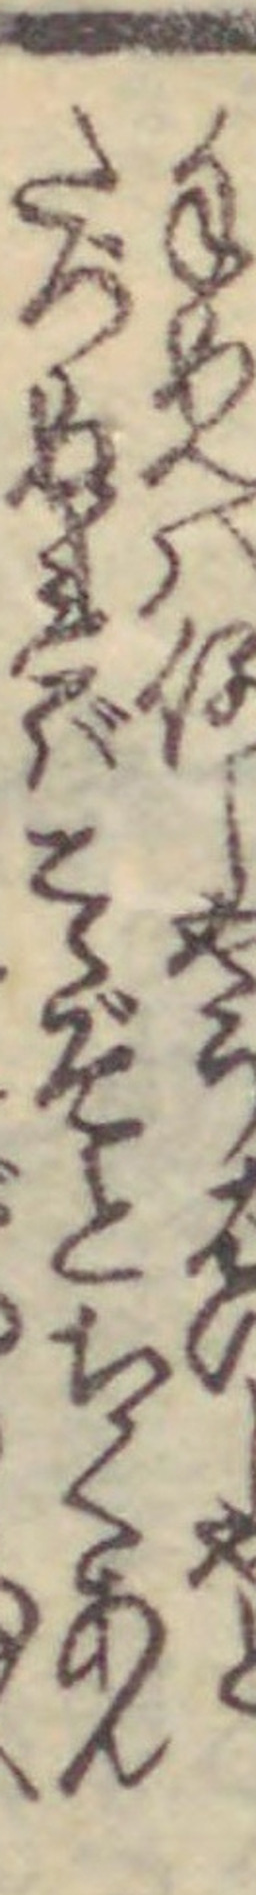たづぬればこゝぞとちくあん
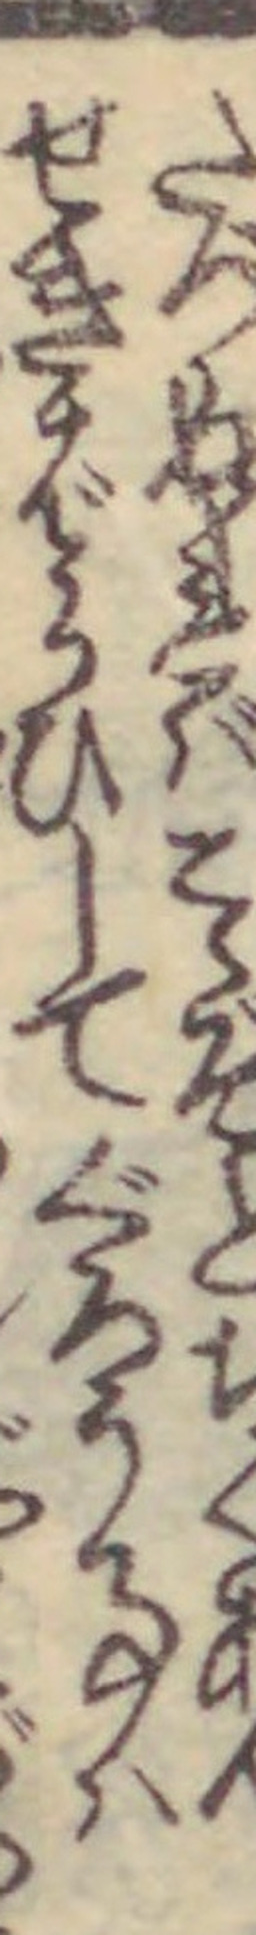せきばらひしてぐろう事は
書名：腹内窺機関 2巻
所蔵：国立国会図書館 National Diet Library, JAPAN
